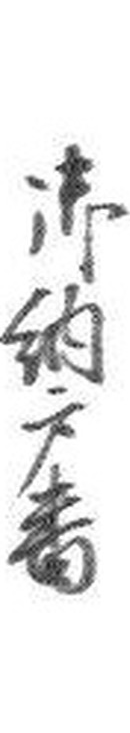御納戸番
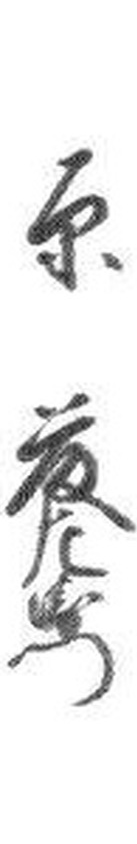原藤左衛門
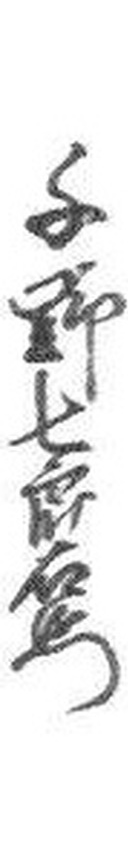千野七郎右衛門

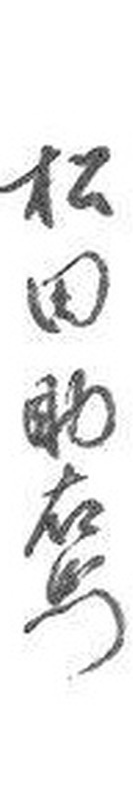松田助右衛門
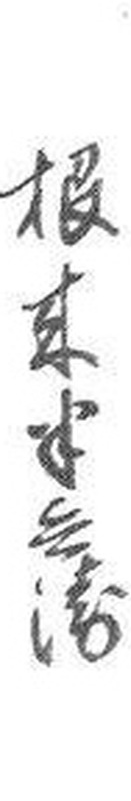根来半兵衛
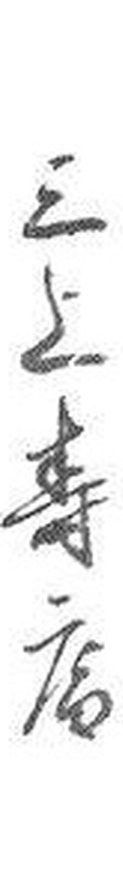三上壽庵
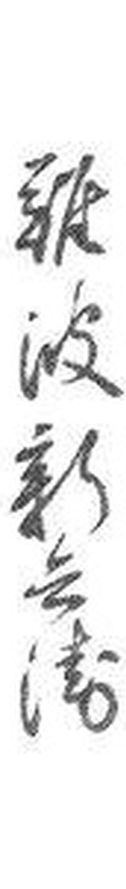難波新兵衛
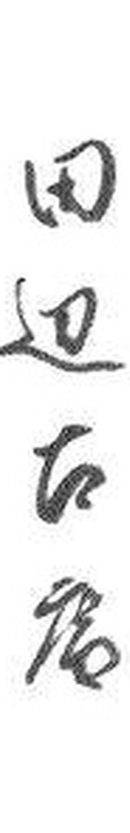田辺古庵
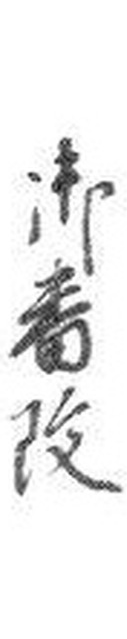御番改
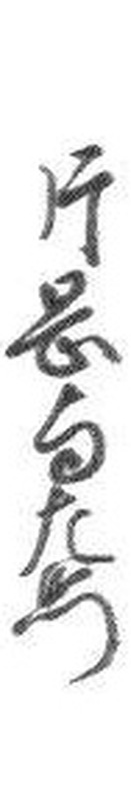片岡与左衛門
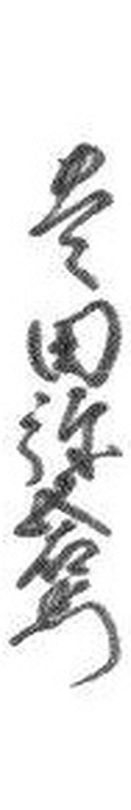豊田弥五右衛門
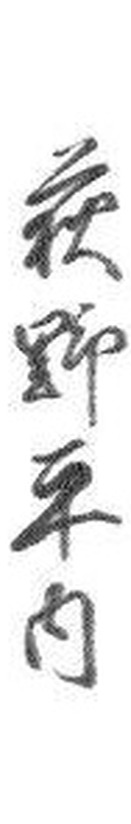荻野平内
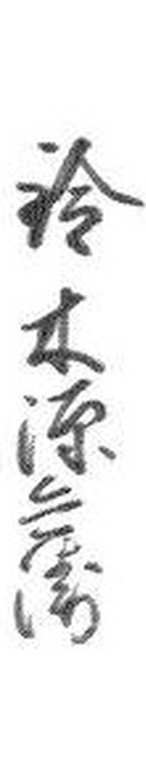鈴木源兵衛
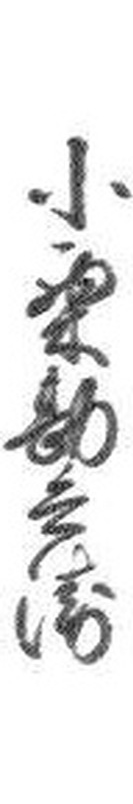小栗勘兵衛

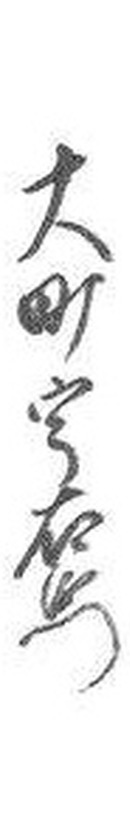大町宇右衛門
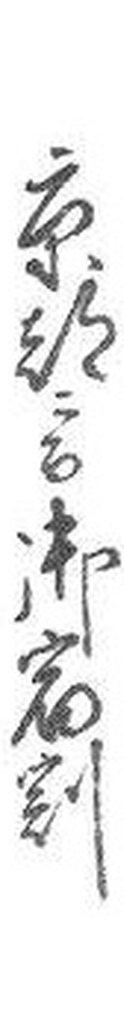京都ニ而御宿割
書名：家譜 四 忠昌公 従寛永七年到正保四年
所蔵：福井県文書館 Fukui Prefectural Archives
